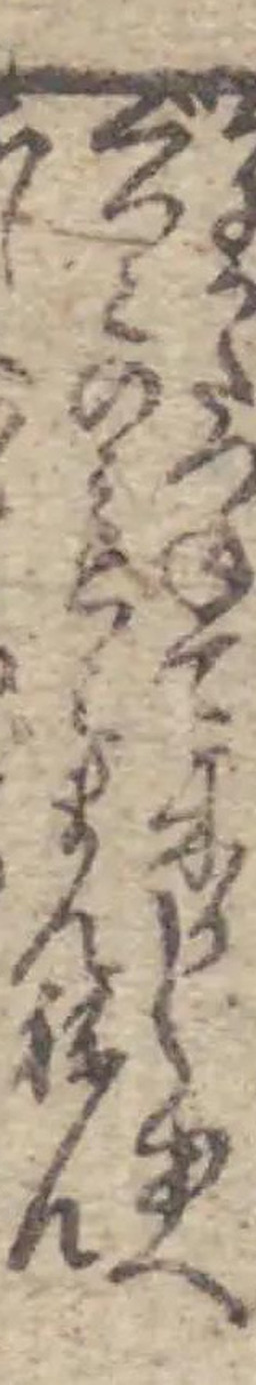ぐつとのみこみまんねん
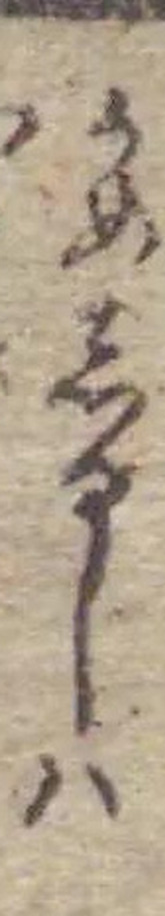かめしるしは
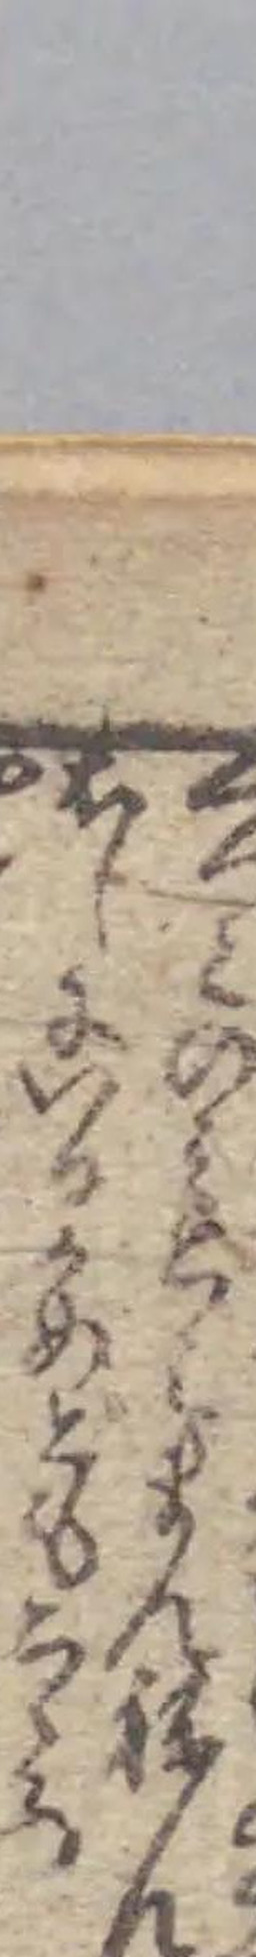はしにいるかめどもこゝろ
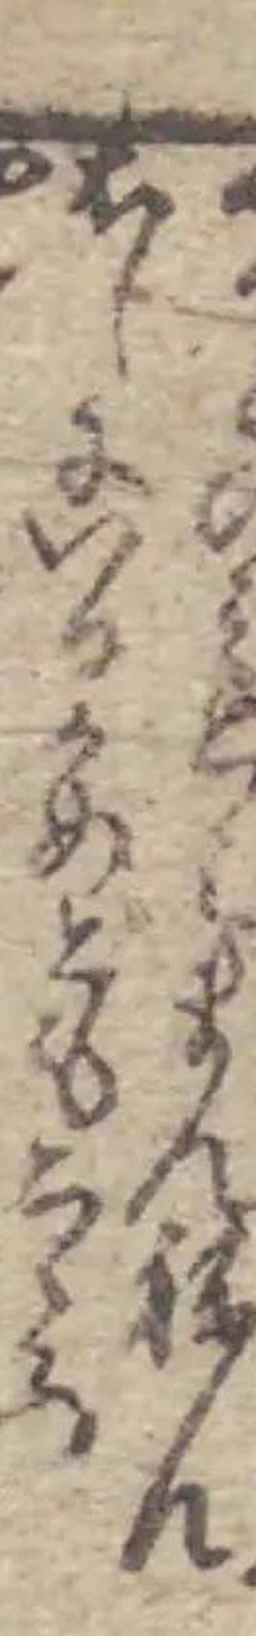はしにいるかめどもこゝろ
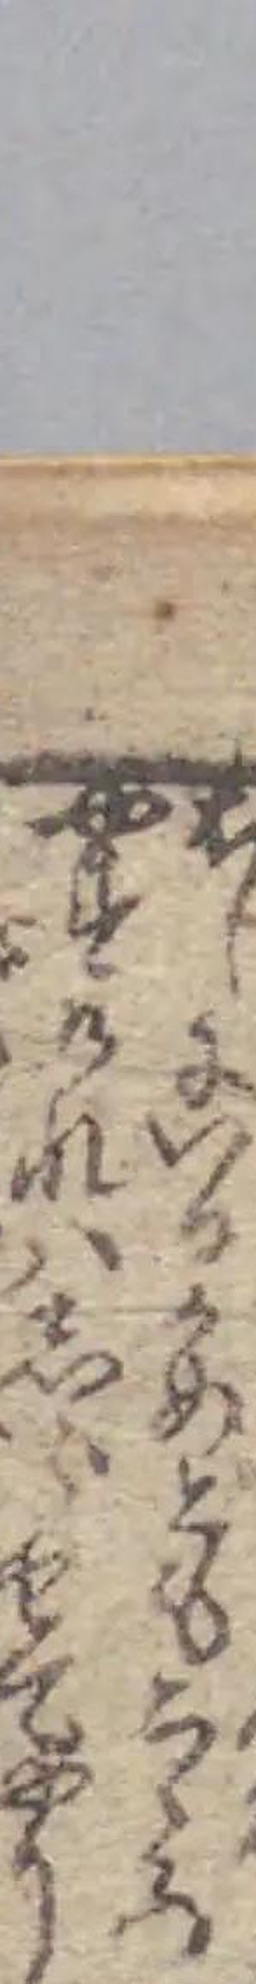やすけれはしらせてやり
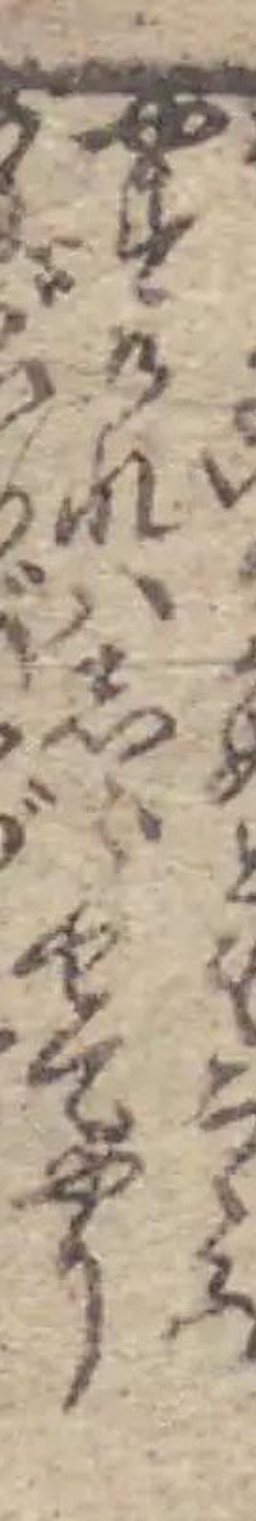やすけれはしらせてやり
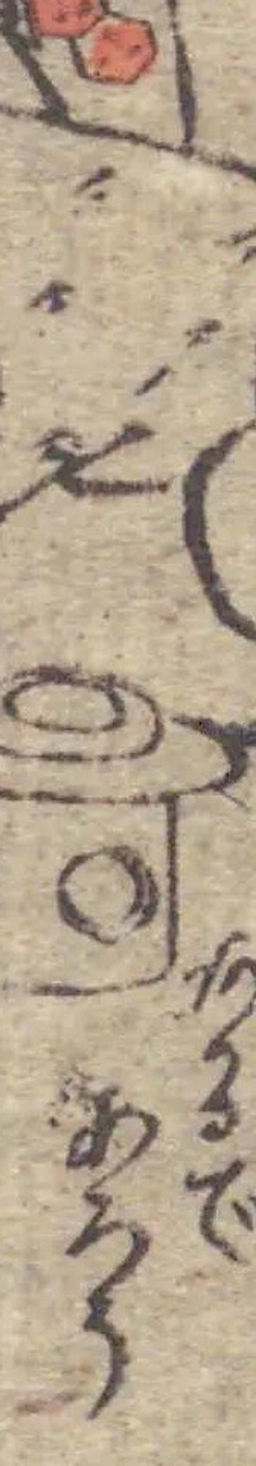あろう
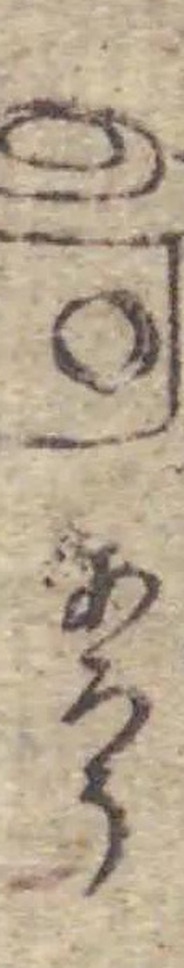あろう
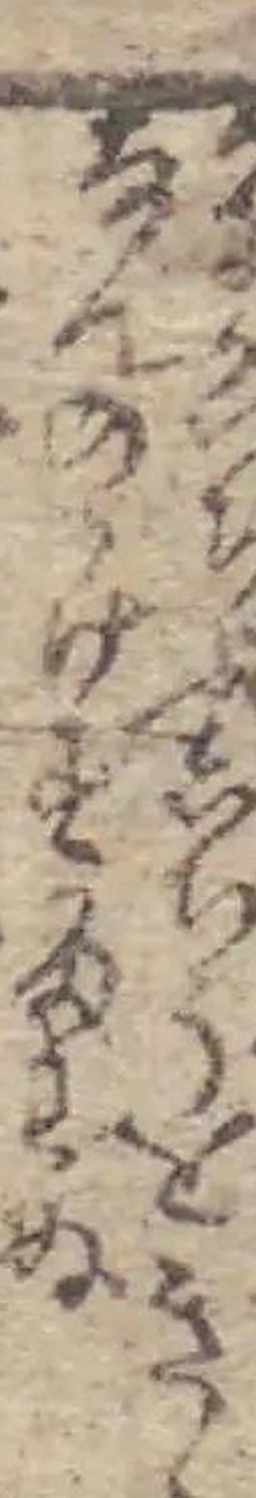なんのかけすかまわぬ
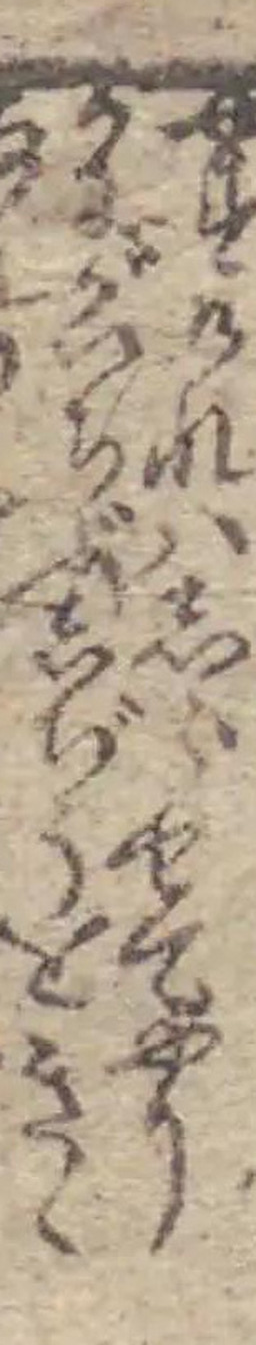かにがいちぶしぢうをきく
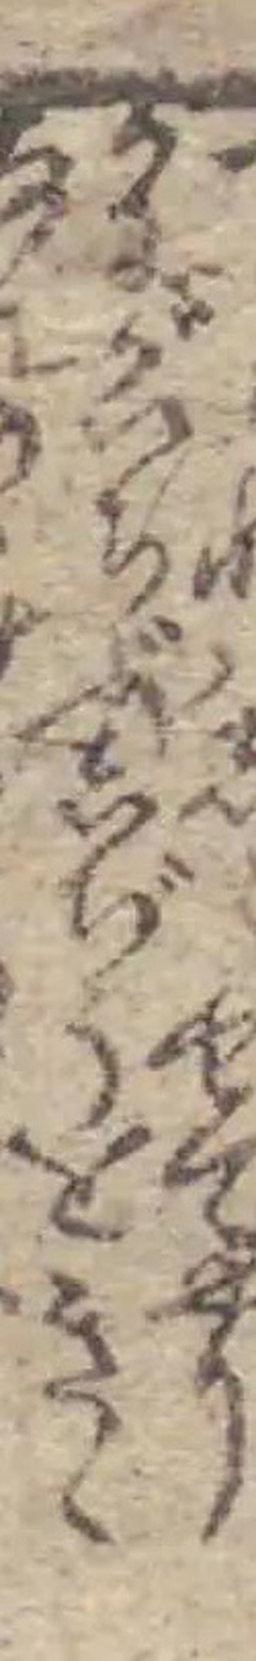かにがいちぶしぢうをきく
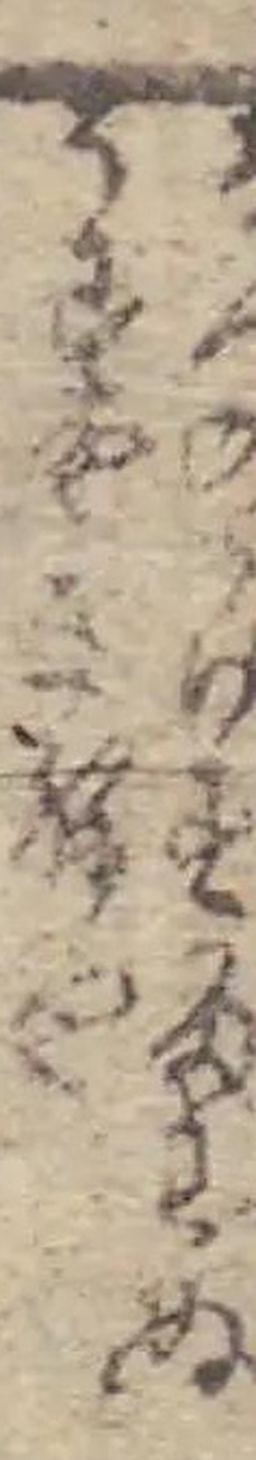うすやきねや
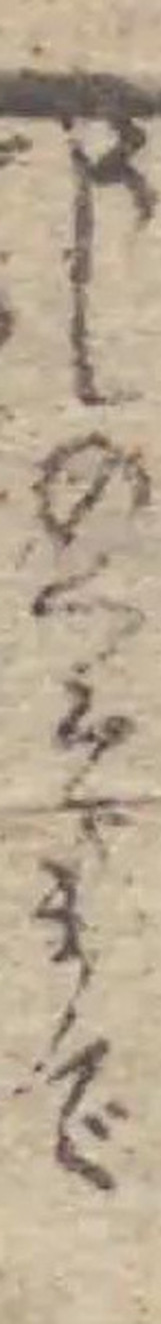うしのくそまで
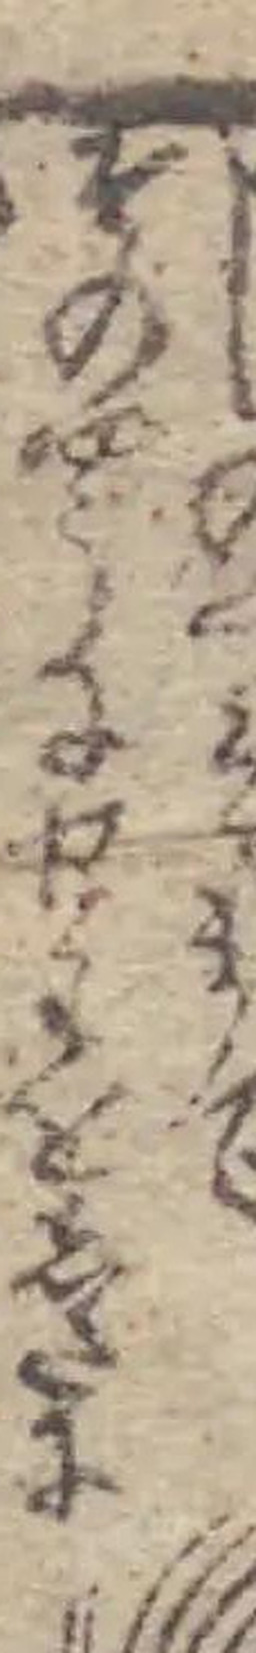そのやうにせわをしたに
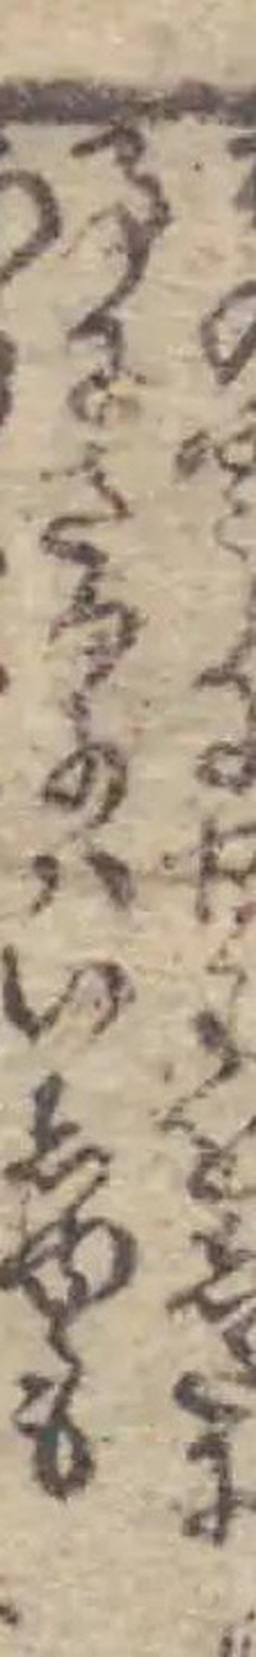事にさるにはいしゆも
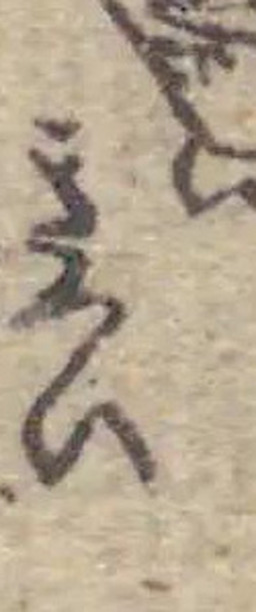きつい
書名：蟹牛房挟多 3巻
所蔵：国立国会図書館 National Diet Library, JAPAN
